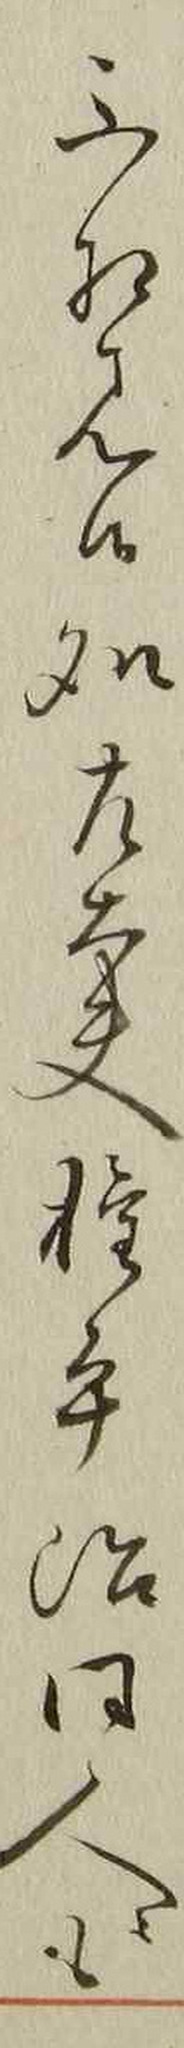不相見候処左太夫権平治同人ニも
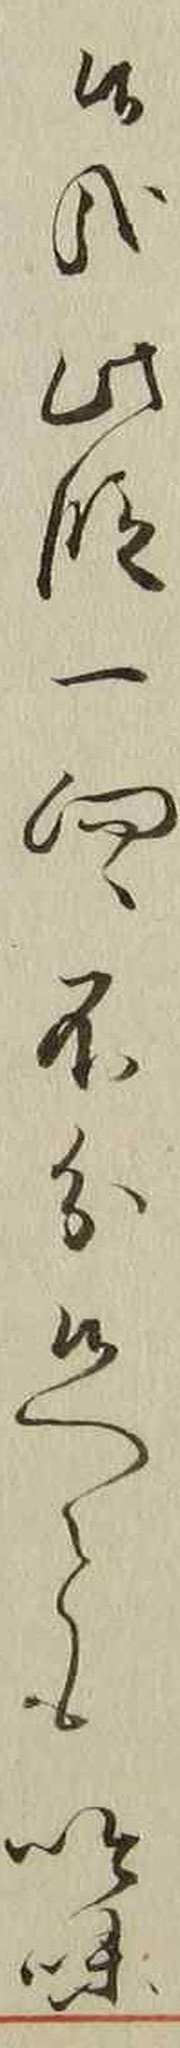候哉此段一向不分候へとも吟味
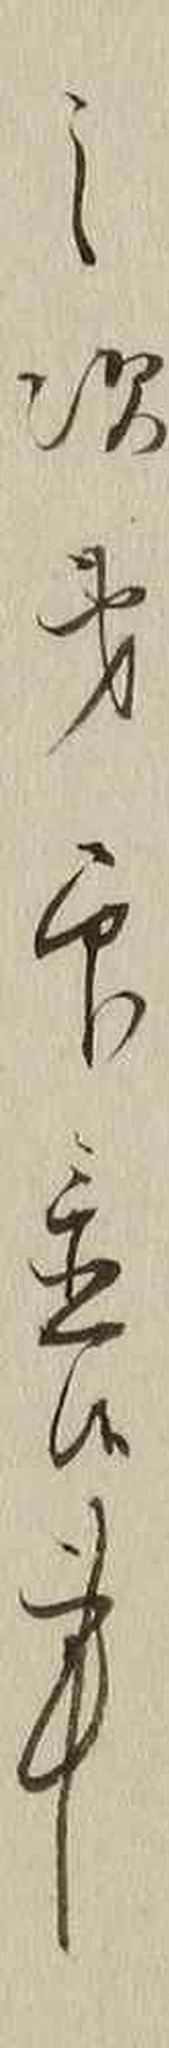之次第印置候事
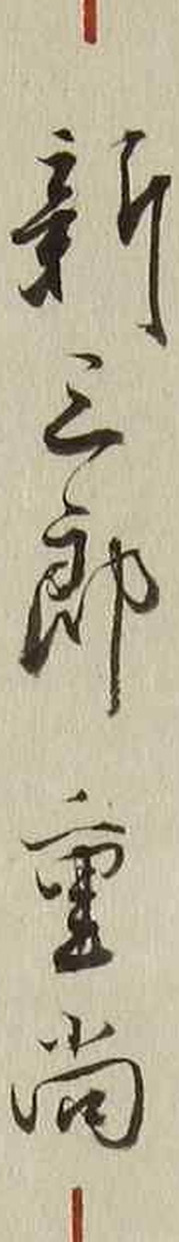新三郎重尚
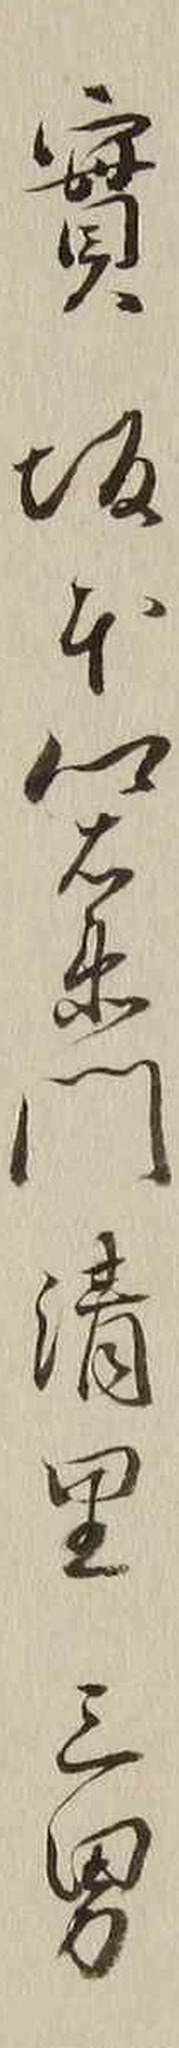実坂本郷右衛門清里三男
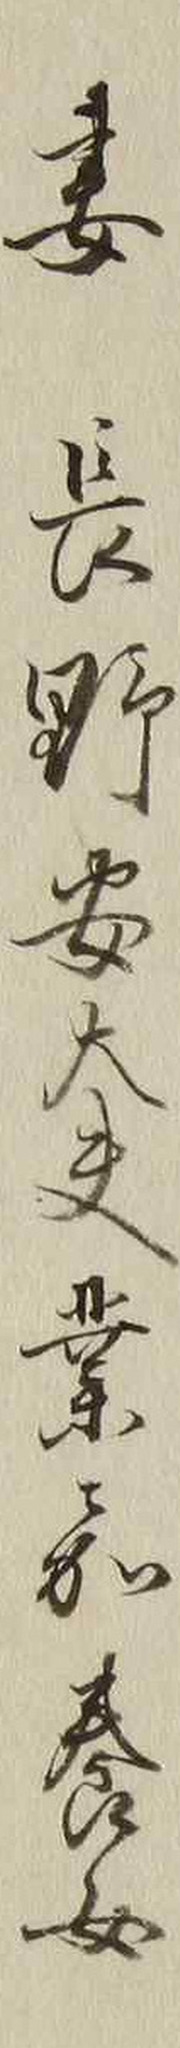妻長野安大夫業嘉養女
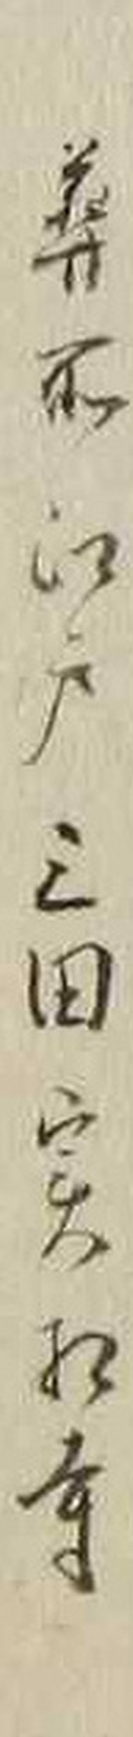葬所江戸三田実相寺
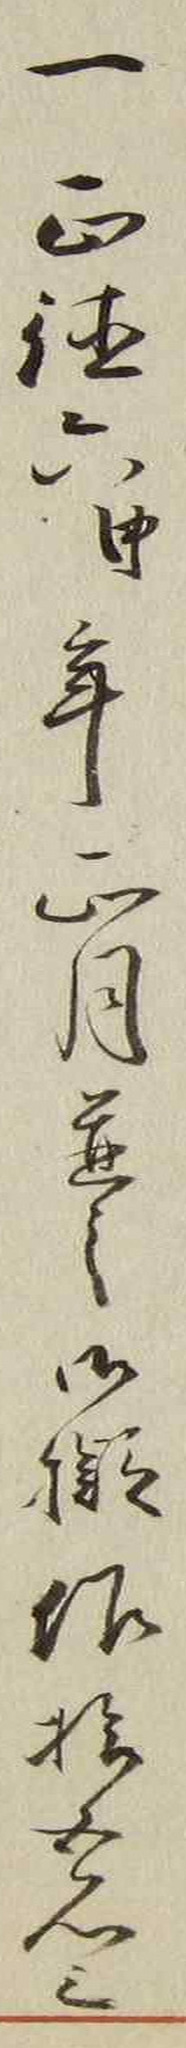一正徳六申年正月並之御擬作拾五石三
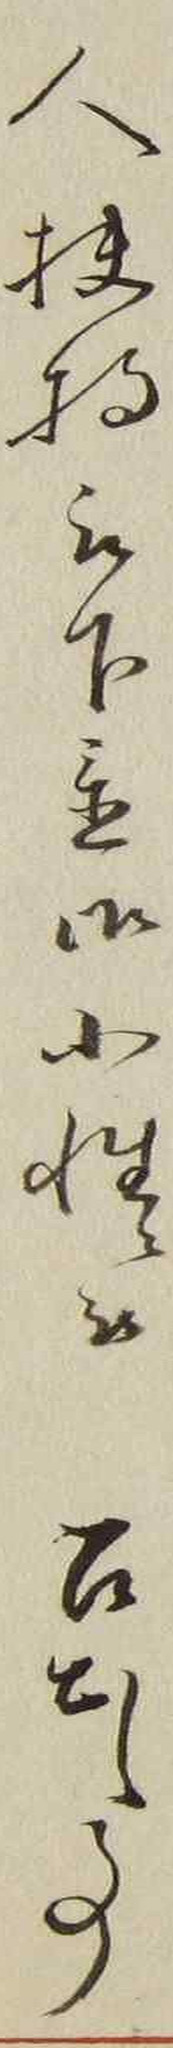人扶持被下置御小性ニ被召出候事

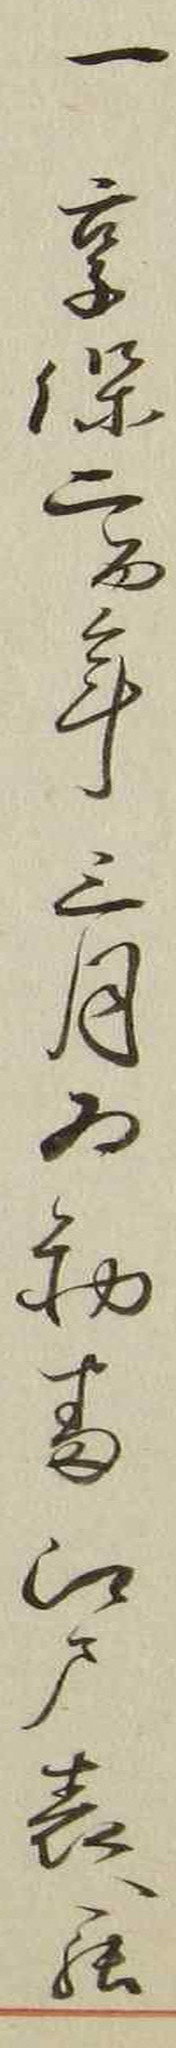一享保二酉年三月為勤番江戸表へ罷
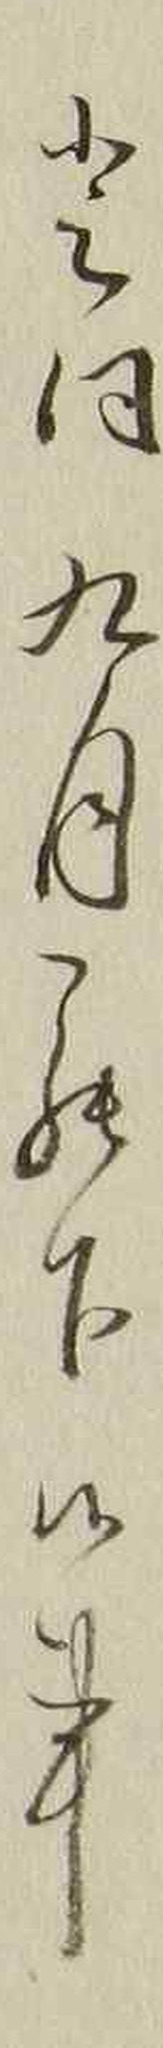登同九月罷下候事
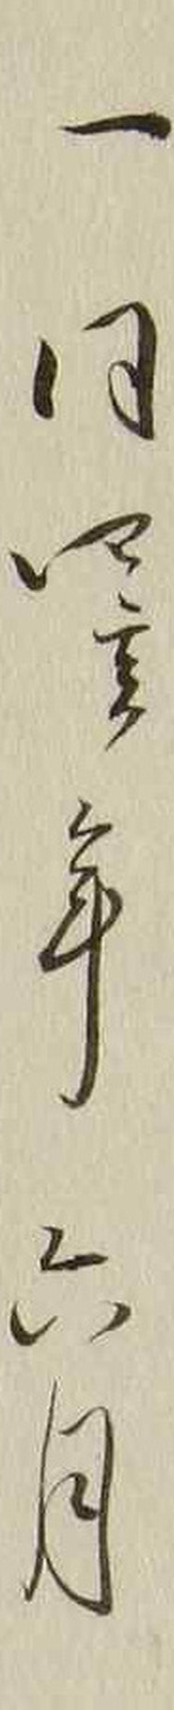一同四亥年六月
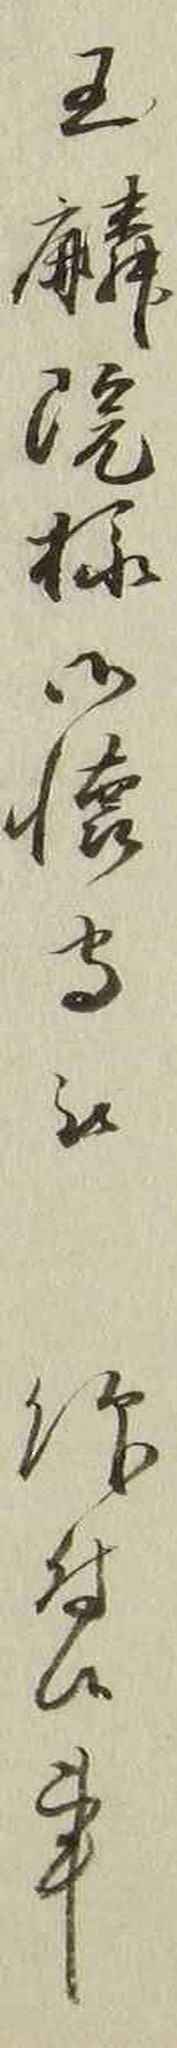王麟院様御懐守被仰付候事
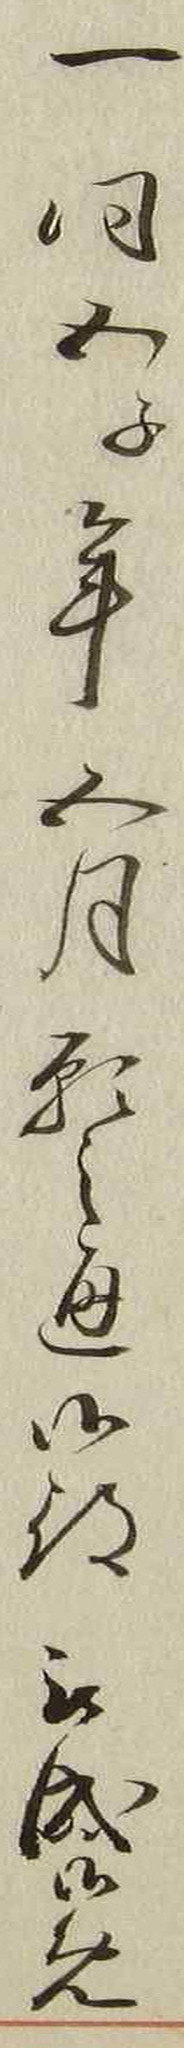一同五子年五月願之通御役被成御免
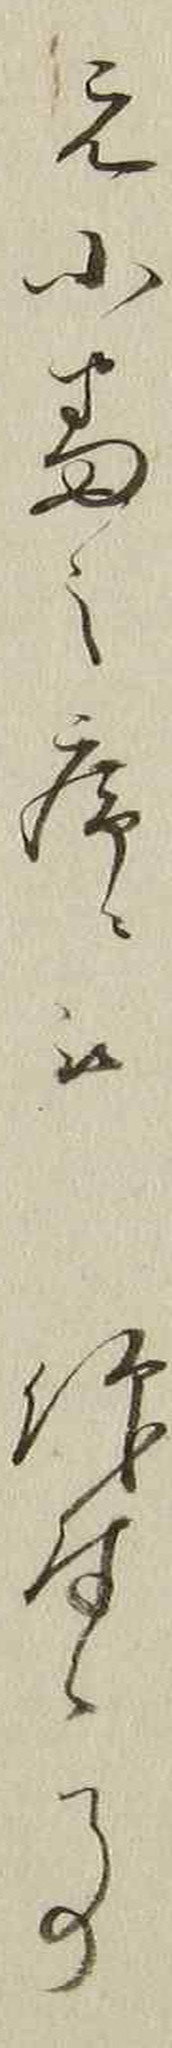元小番之席ニ被仰付候事
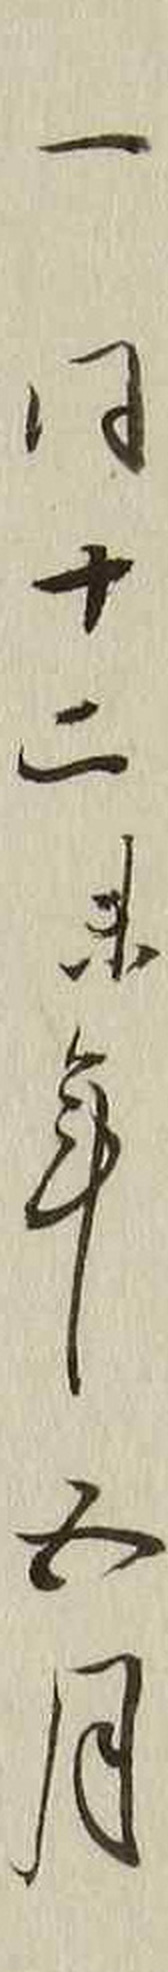一同十二未年五月
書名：諸士系譜　巻之28　い之部28
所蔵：会津若松市立会津図書館
